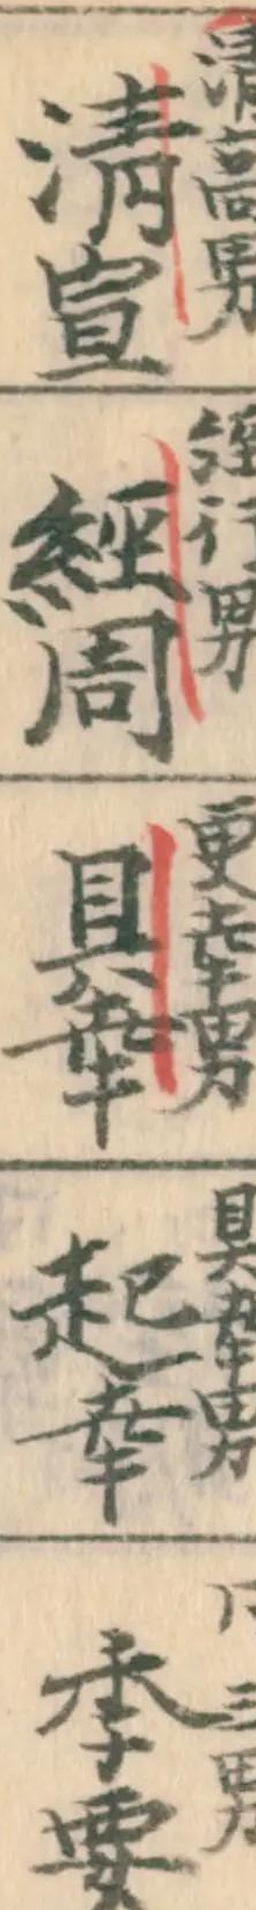清宣経周具幸起幸季要
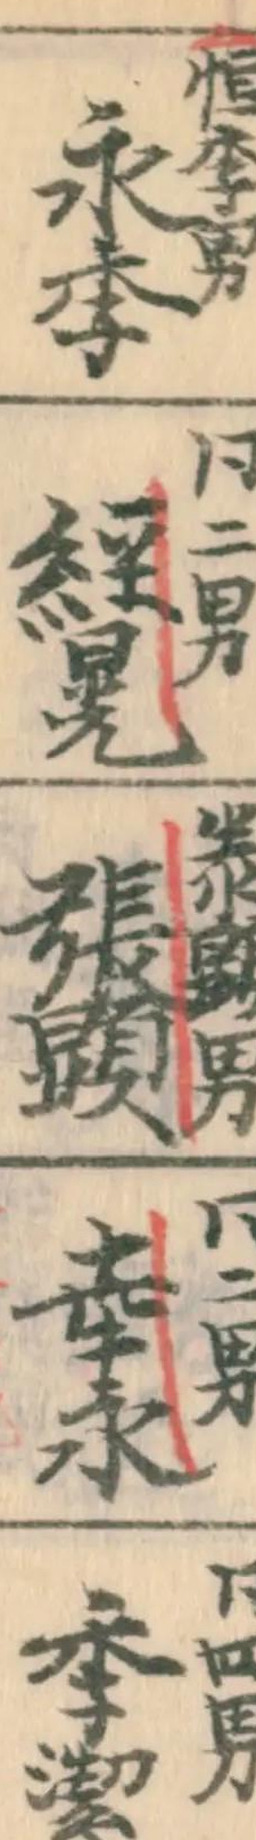永季経晃張顕幸永季潔
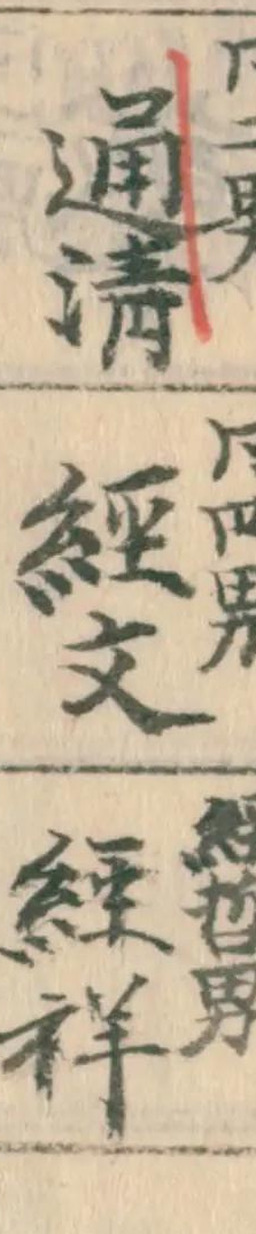通清経文経祥
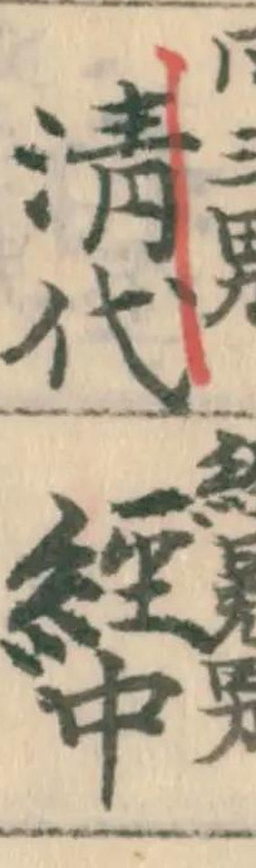清代経中

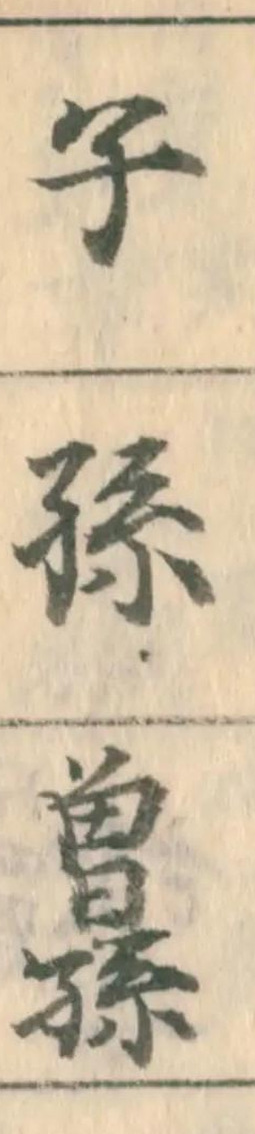子孫曽孫
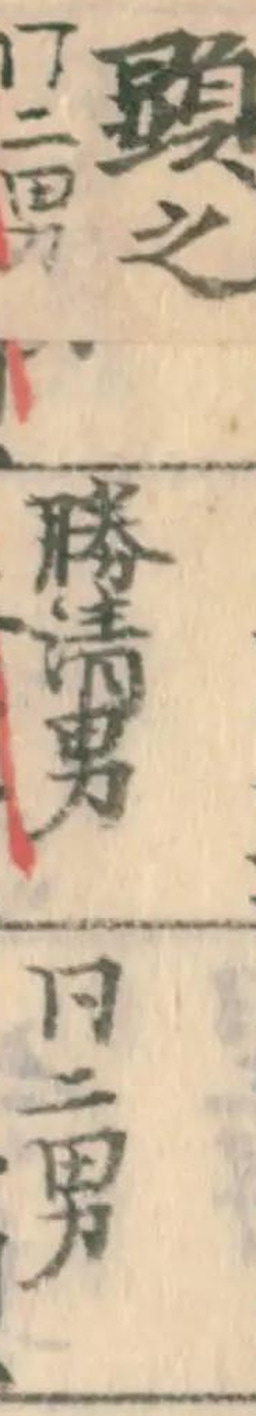同二男
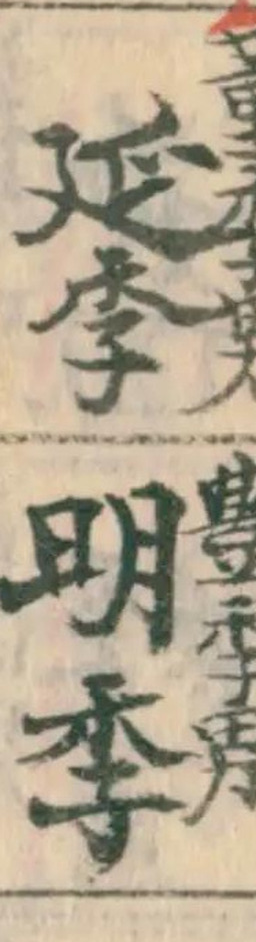延季明季

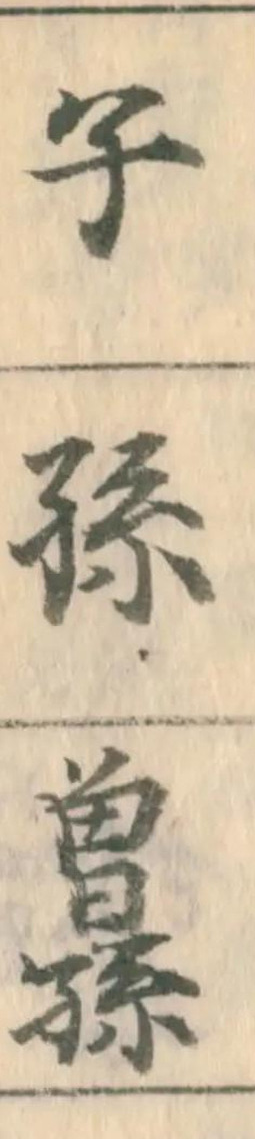子孫曽孫
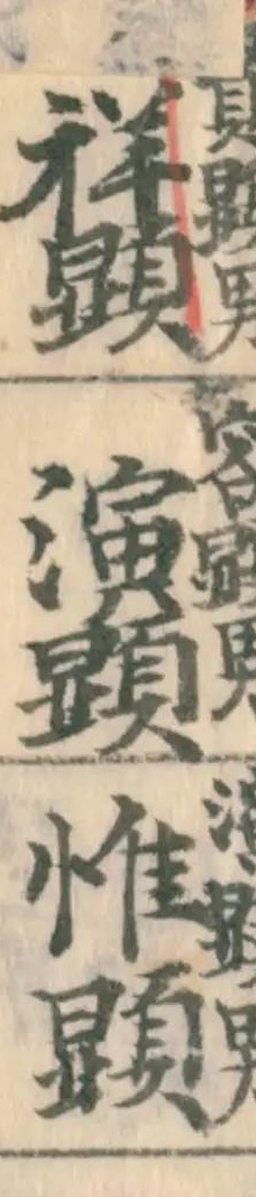祥顕演顕惟顕
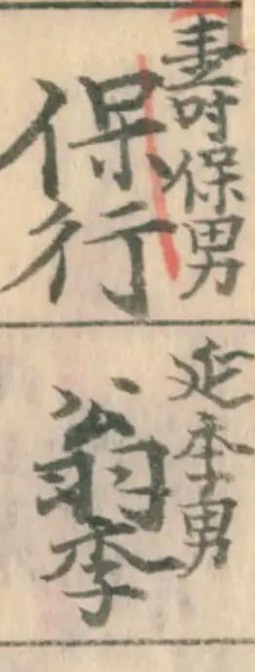保行翁季
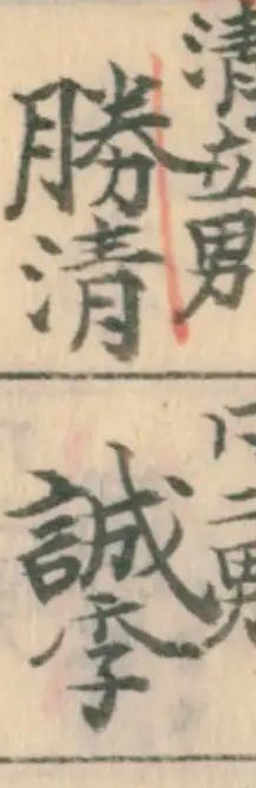勝清誠季
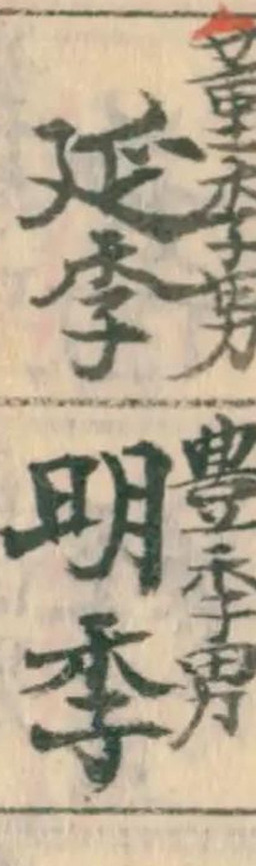延季明季

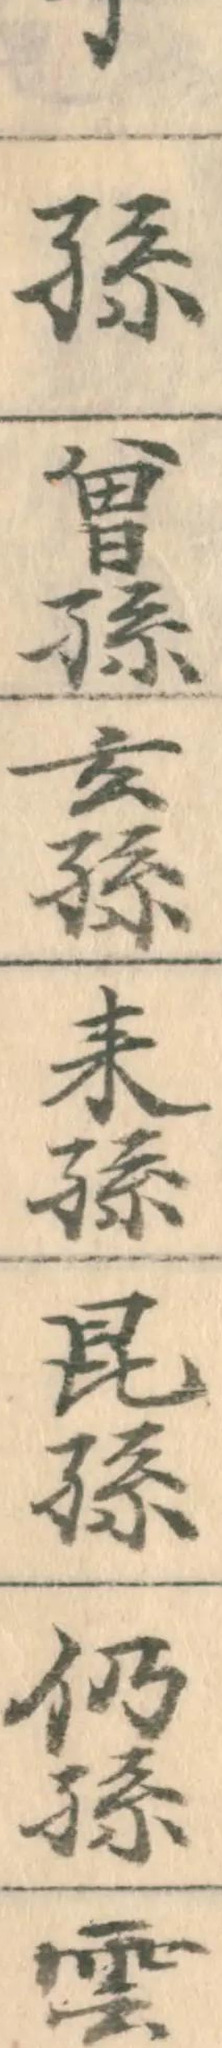子孫曽孫玄孫来孫昆孫仍孫雲孫
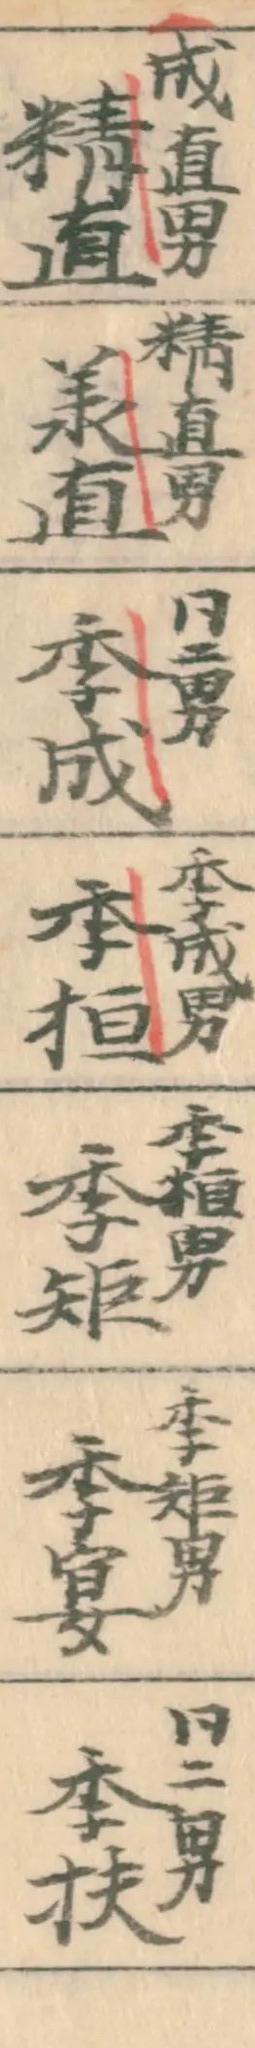精直承直季成季桓季矩季宴季扶
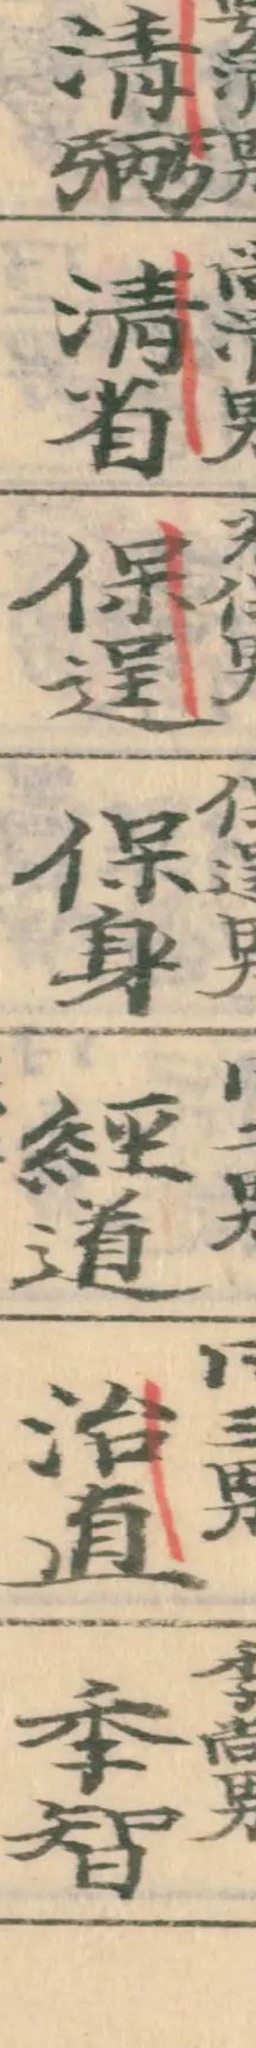清弻清省保逞保身経道治直季智
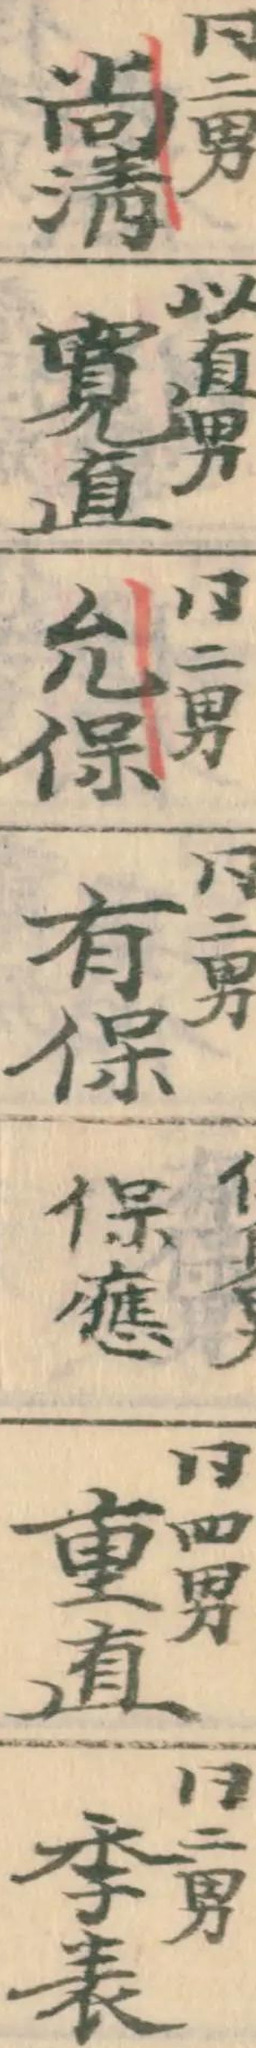尚清寛直允保有保保応重直季表
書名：賀茂社記録. 第24冊
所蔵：国立国会図書館 National Diet Library, JAPAN
